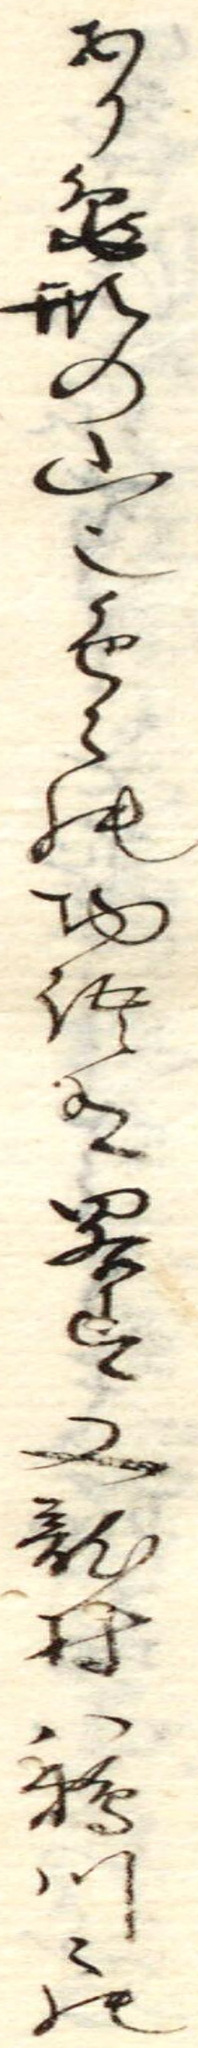あり亀形の山也色々の物語有略す又龍村は鵜川々の
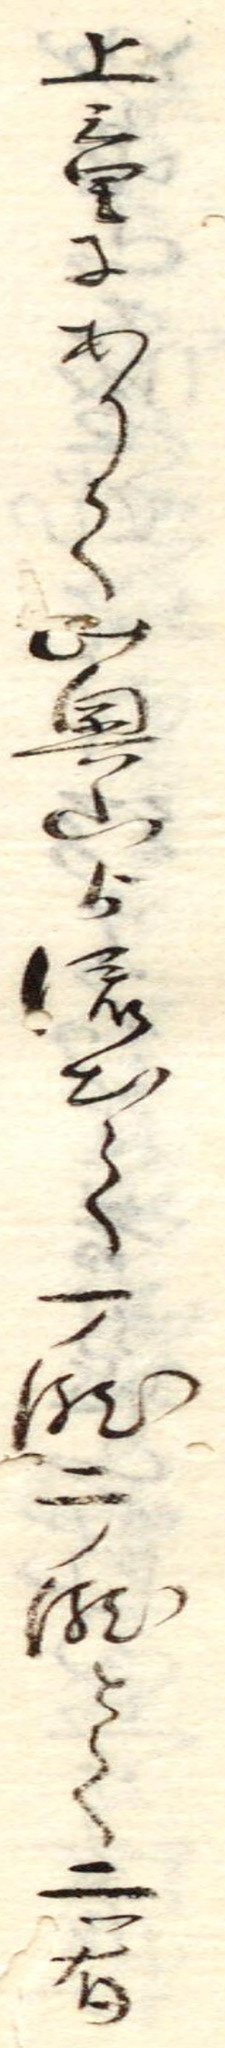上三里にありて此奥山ゟ流出して一ノ瀧二ノ瀧とて二ッ有
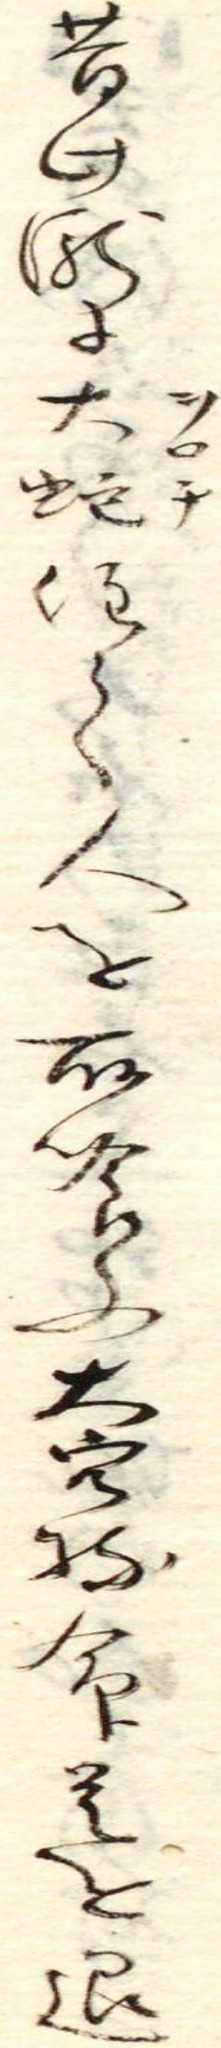昔此瀧に大蛇住て人を取喰ふ大穴抔命是を退
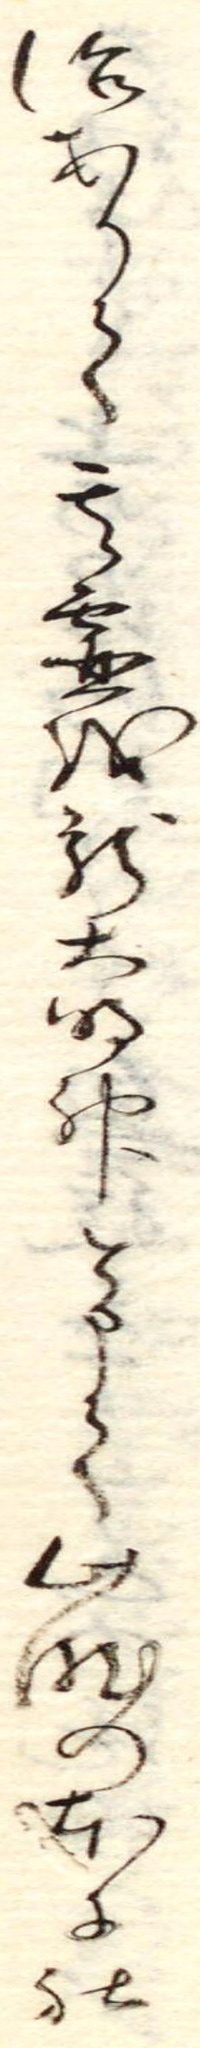治ありて其霊を龍大明神と申して此瀧の本に社
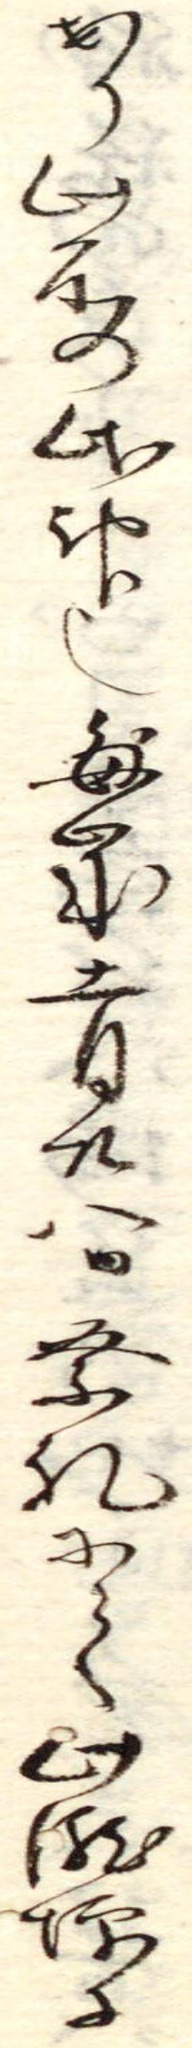あり此所の氏神也毎歳十一月廿八日祭礼にて此瀧坪に
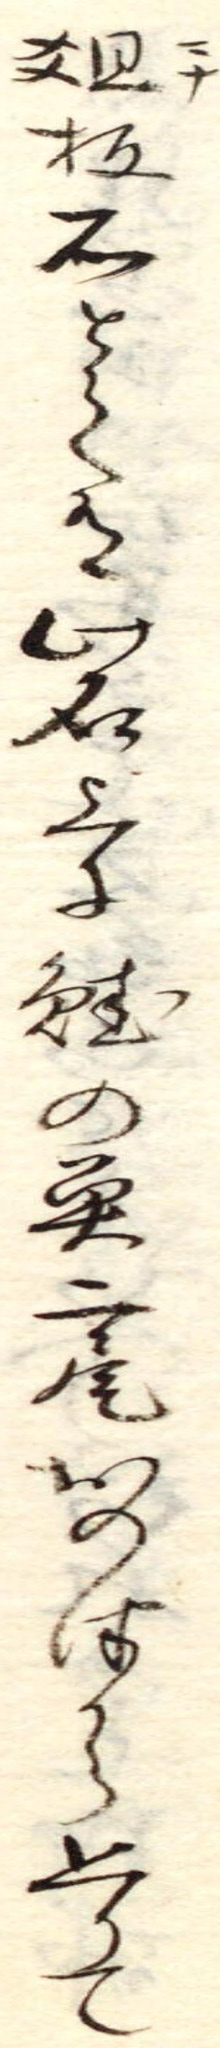俎板石とて有此石上に鮭の魚二尾おのつから上りて
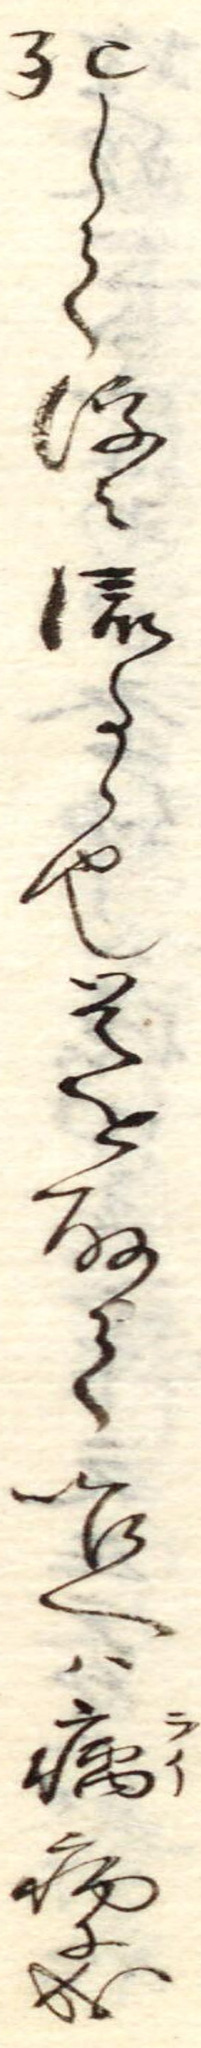死して浮々流るゝ也是を取て咋へは癗病に成
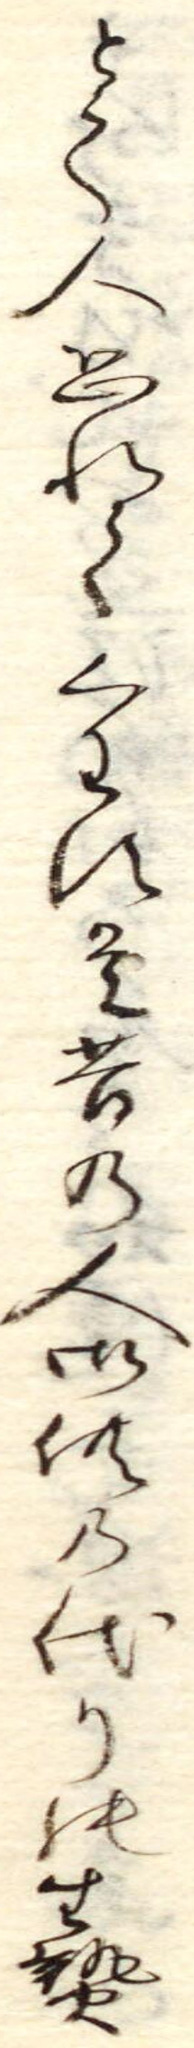とて人恐れてくわす是昔の人御供の代りの生贄
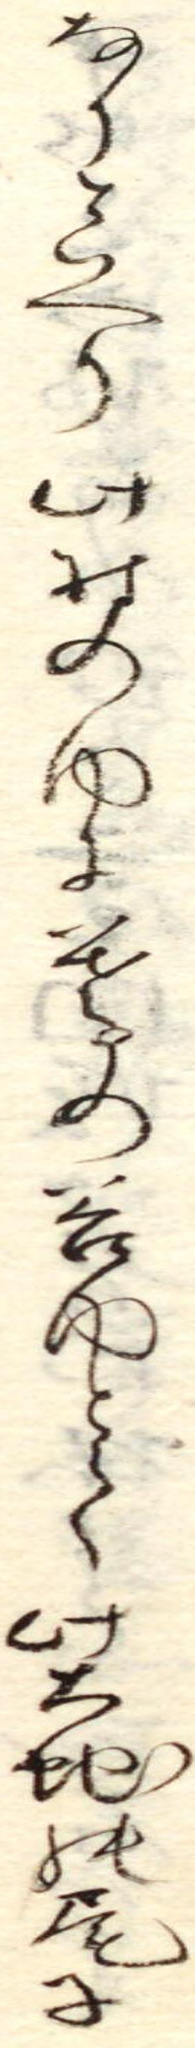なりといへり此村の内に暮の谷内とて此大地の尾に
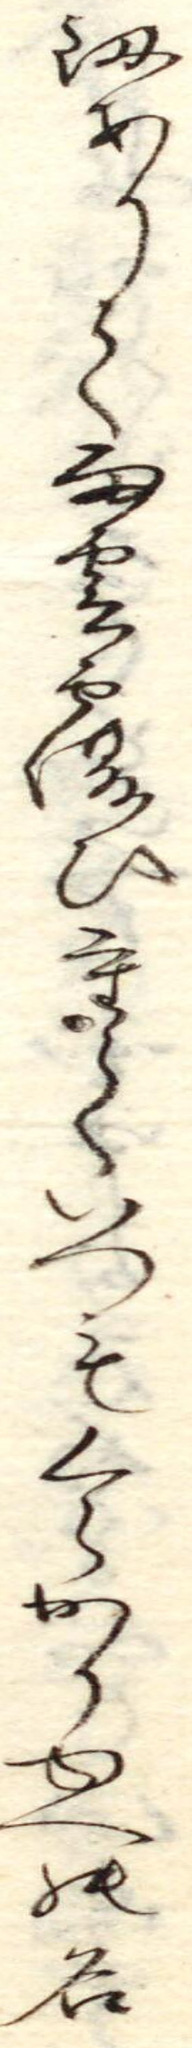釼ありて雨雲覆ひ重ていつもくらかりゆへの名
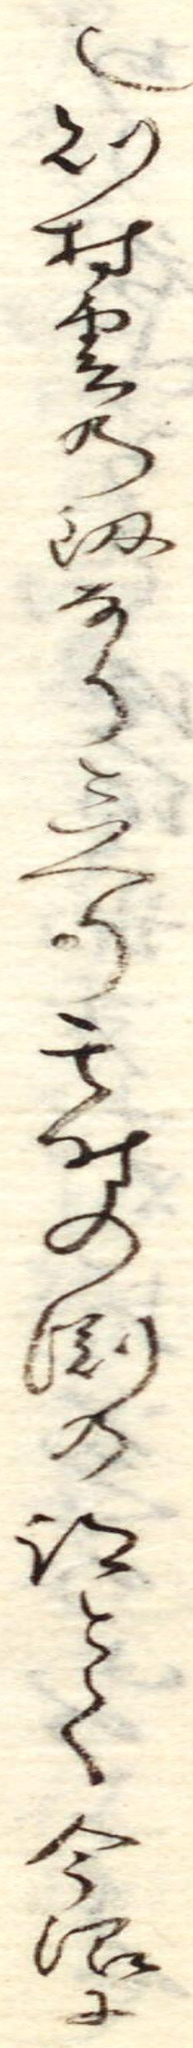也則村雲の釼なりといへり其時の渕の跡とて今沼に
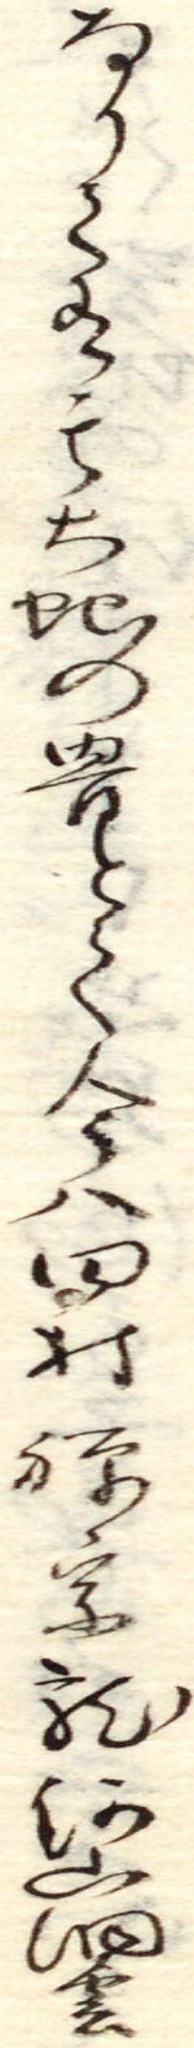なりて有其大地の骨とて今八田村禅宗龍河山洞雲
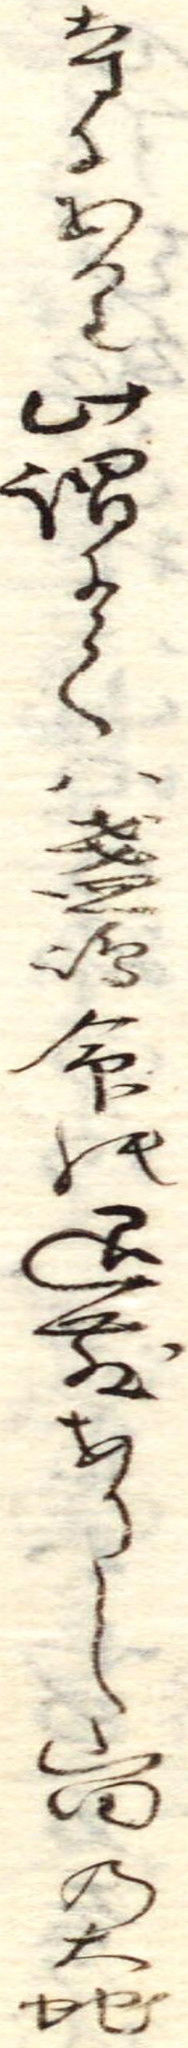寺にあり此謂にては盞嶋命の退散ありし山田の大地
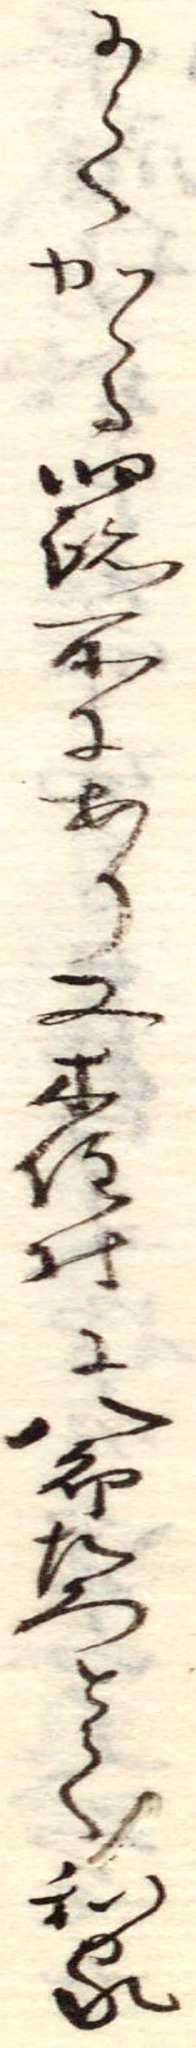にてかゝる旧跡所にあり又木住村に八郎左衛門とて利家
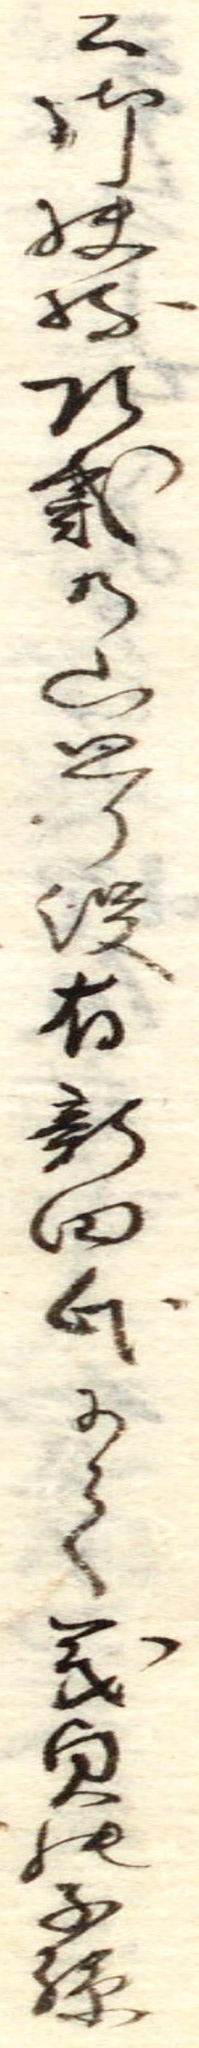公御扶持頂戴の山廻り役有新田氏にて義貞の子孫
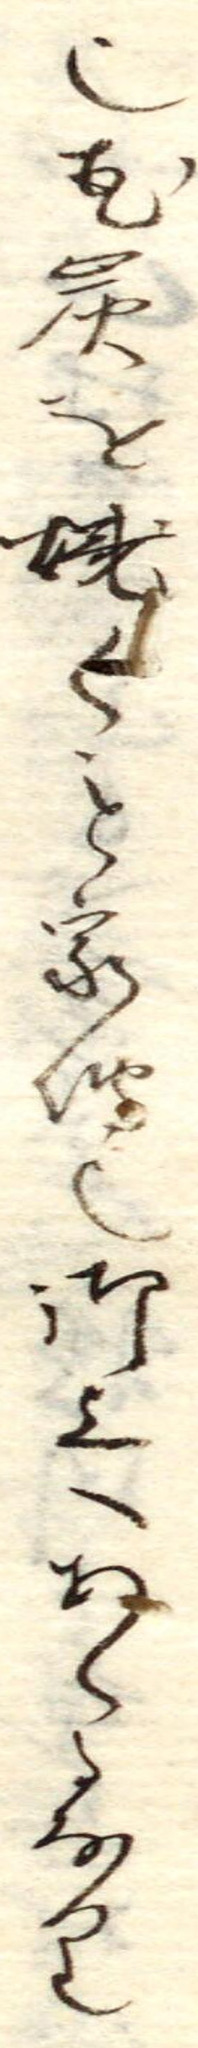也尤炭を焼くこと家伝也御上へあくるなり
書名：能登名跡誌
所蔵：Ishikawa Prefectural Library
